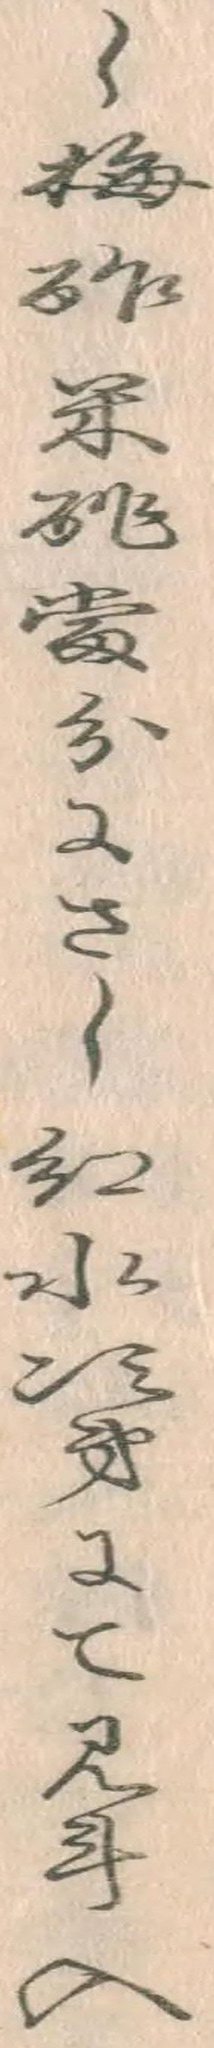し梅酢米酢当分にさし紅水次第にて見斗入
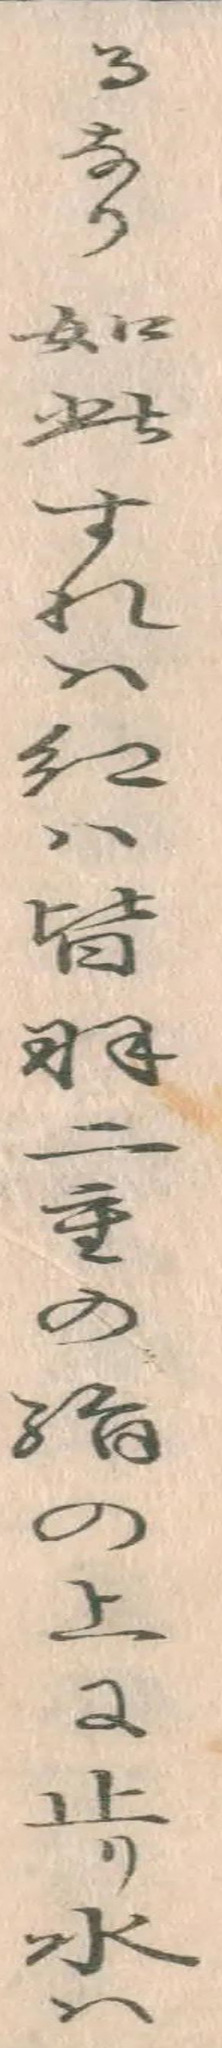るなり如此すれは紅は皆羽二重の絹の上に止り水は
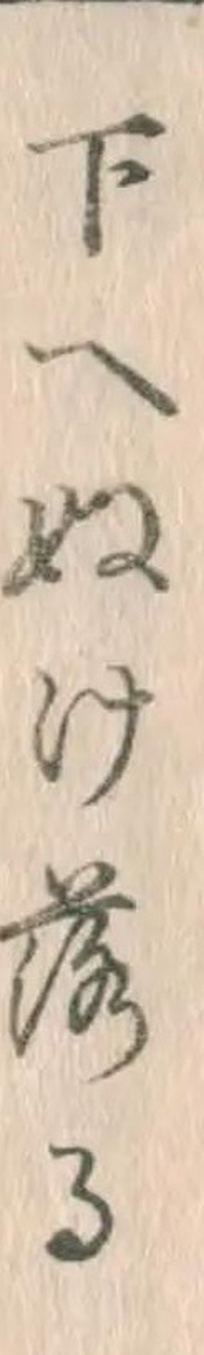下へぬけ落る
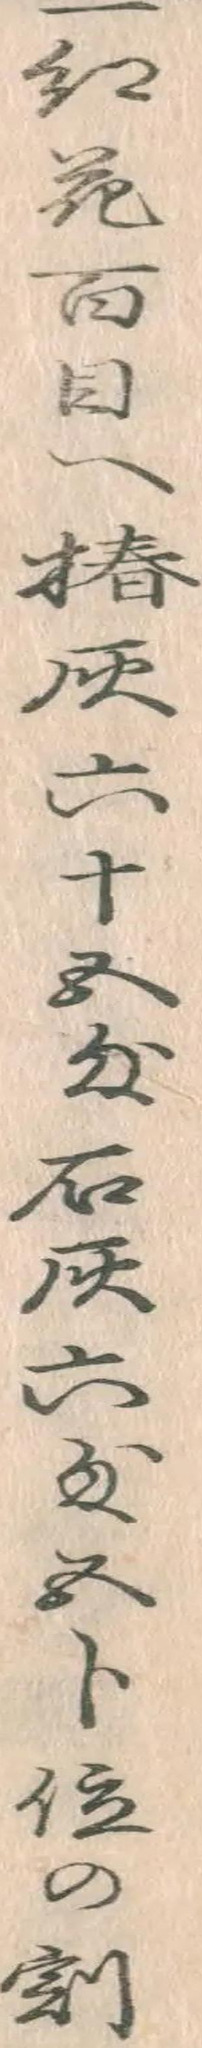一紅花百目へ椿灰六十五匁石灰六匁五分位の割
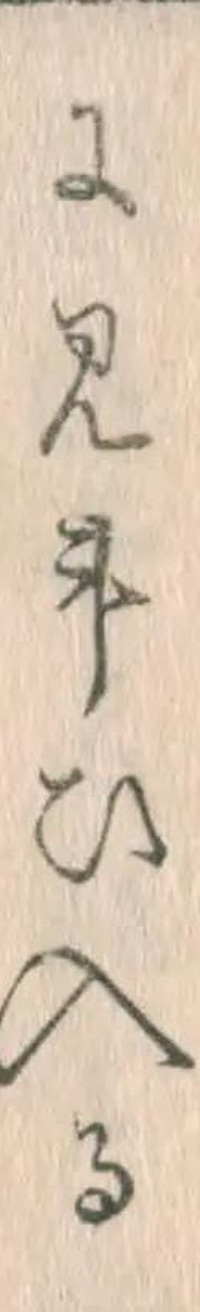に見斗ひ入る
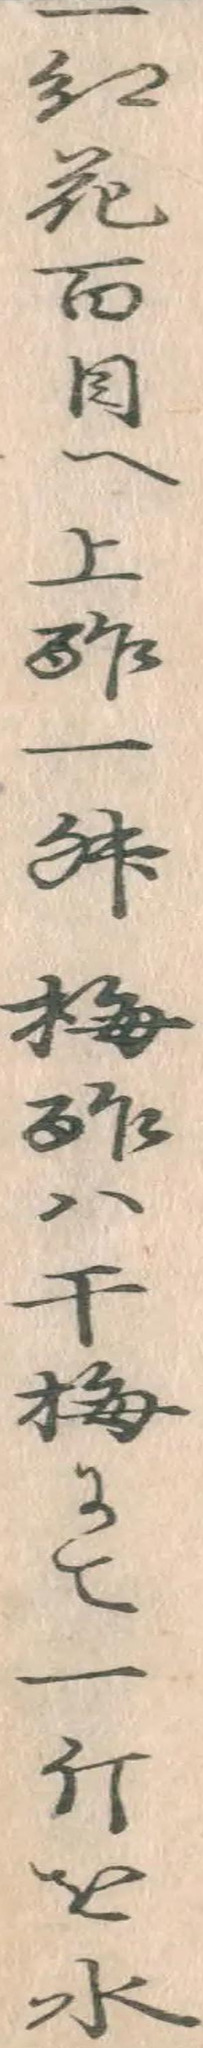一紅花百目へ上酢一升梅酢は干梅にて一斤を水
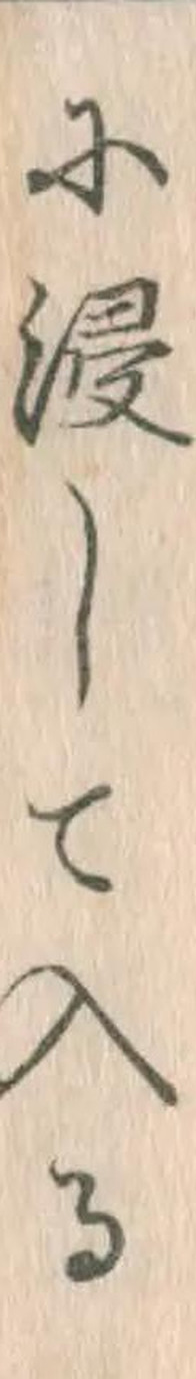に浸して入る
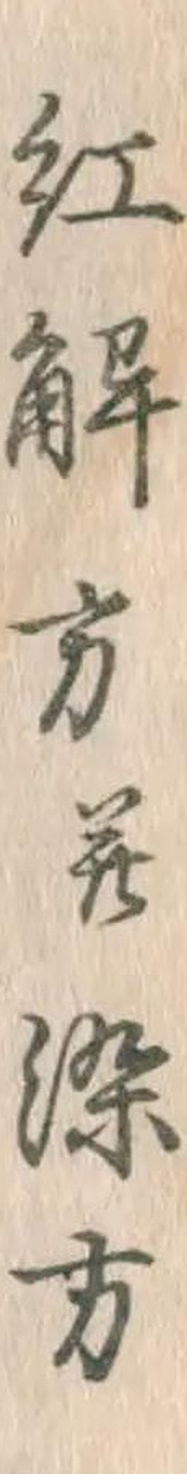紅解方幷染方
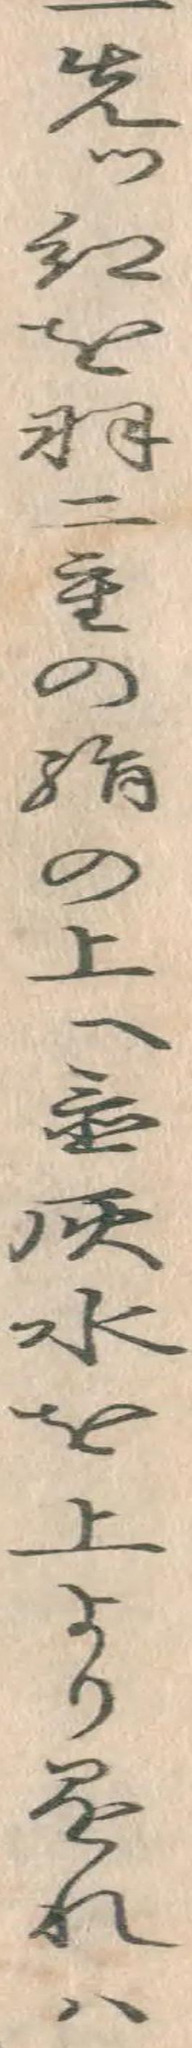一先つ紅を羽二重の絹の上へ置灰水を上より懸れは
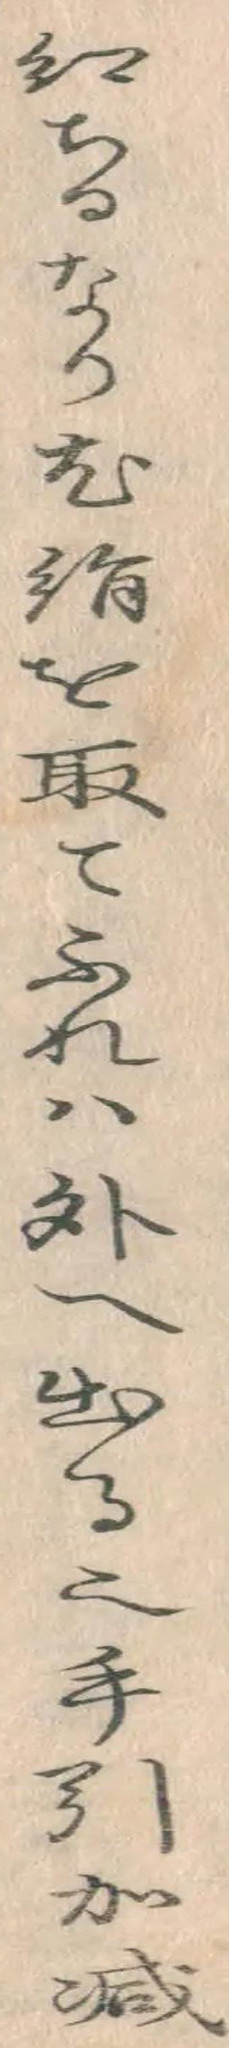紅ちるなり尤絹を取てふれは外へ出る也手引加減

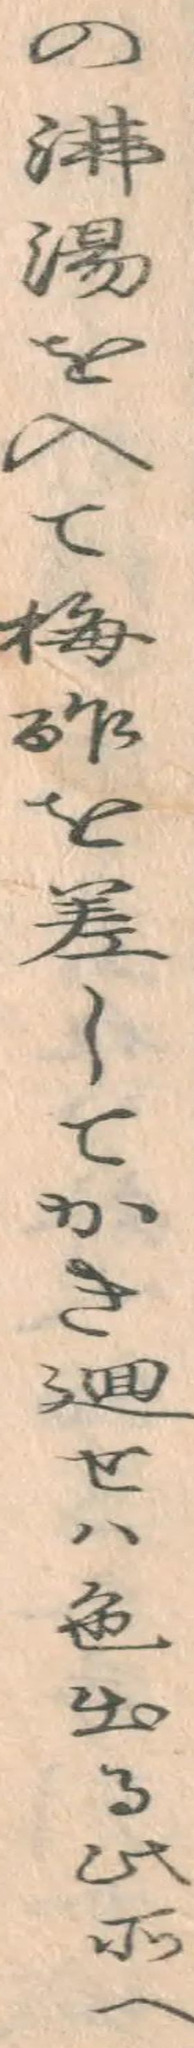の沸湯を入て梅酢を差してかき廻せは色出る此所へ
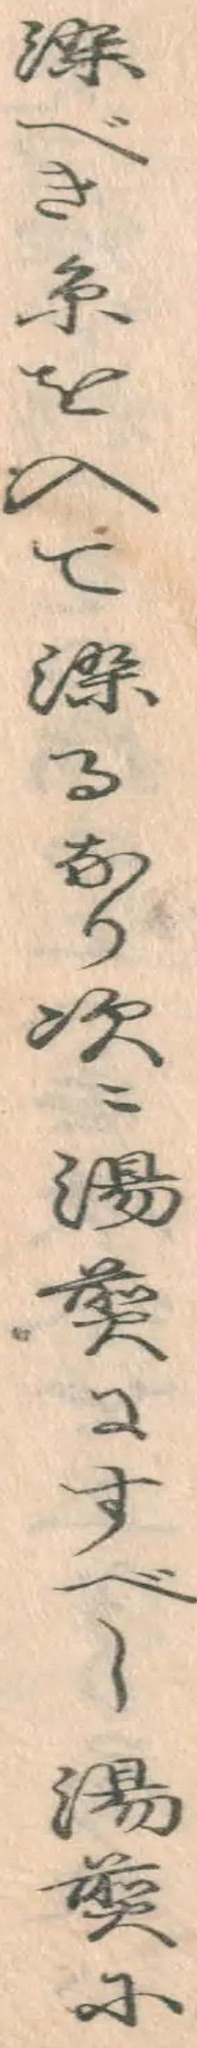染べき糸を入て染るなり次に湯煎にすべし湯煎に
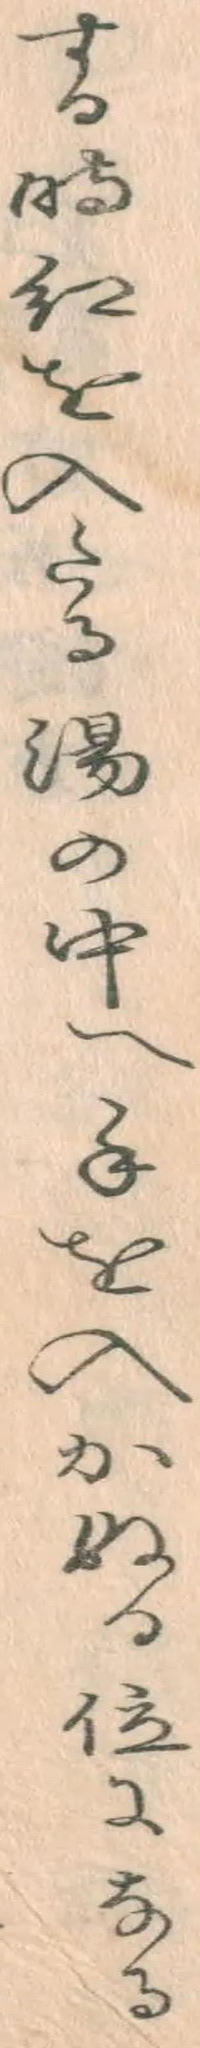する時紅を入たる湯の中へ手を入かぬる位になる
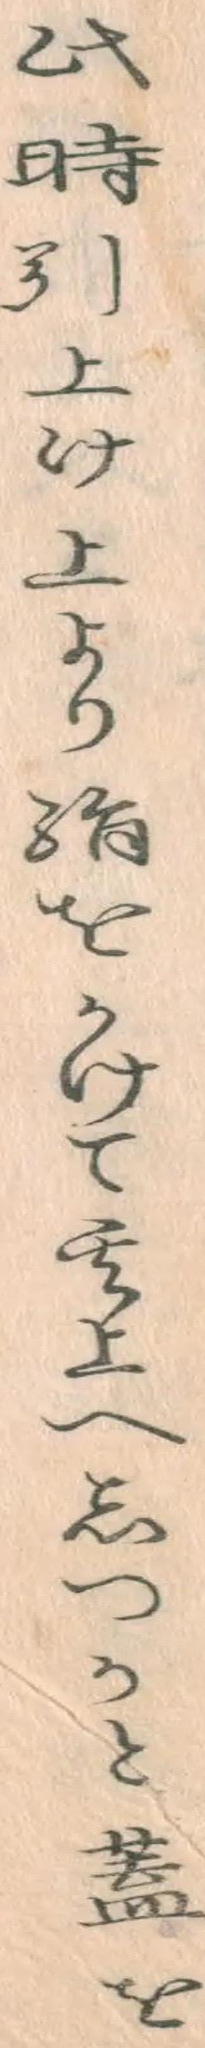此時引上け上より絹をかけて其上へしつかと蓋を
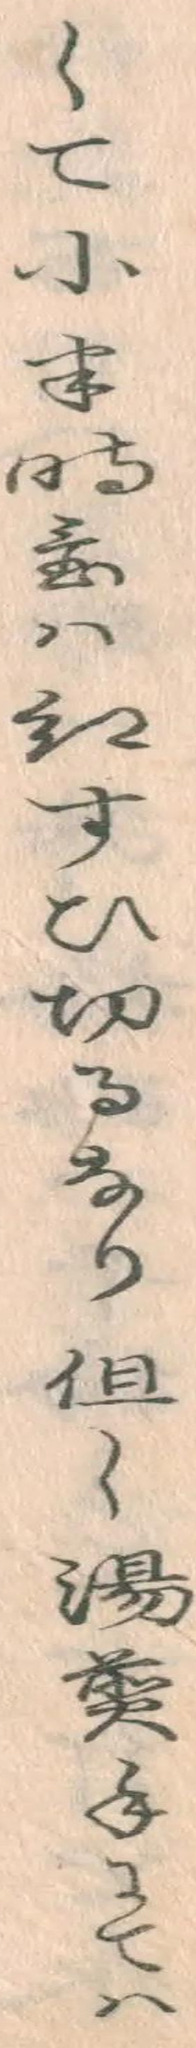して小半時置は紅すひ切るなり但し湯煎手にては
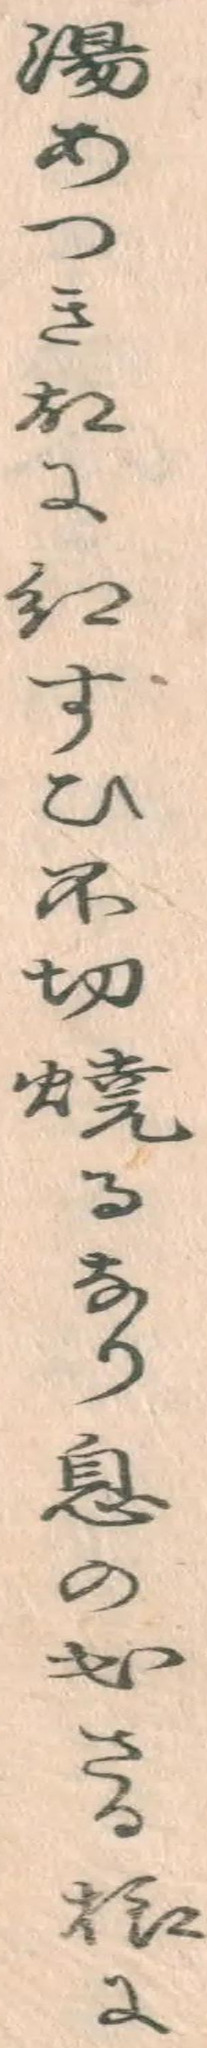湯あつき故に紅すひ不切焼るなり息の出さる様に
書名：機織彙編 5巻. [1]
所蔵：国立国会図書館 National Diet Library, JAPAN
